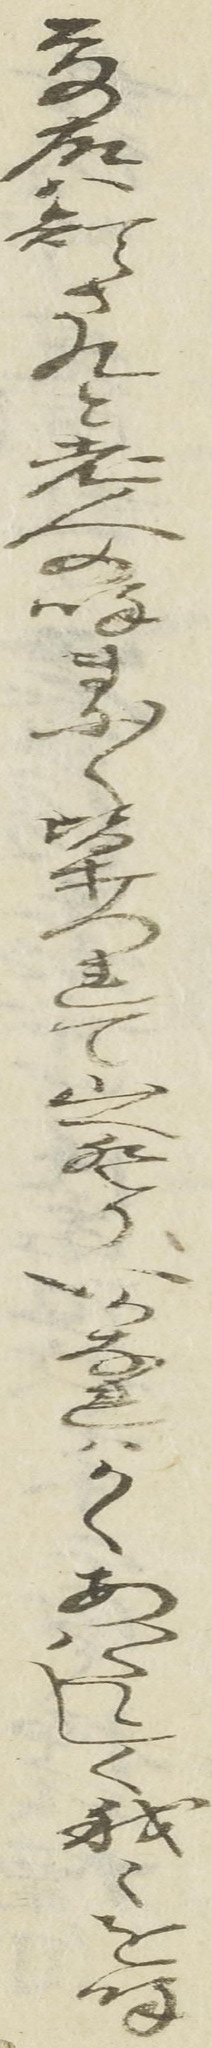その故ハ知らされと老人の呼まに〳〵皆打つれて山へ登りいかなれハかくあハたゝしく我〻を呼
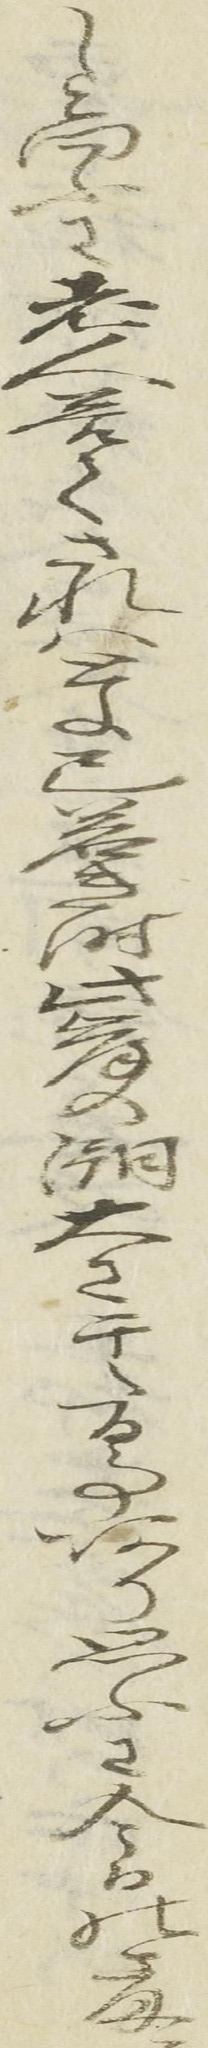しと問ふに老人答てされハとよ己若き時此岸の潮大に干たる事あり思ふに今日のさまニ
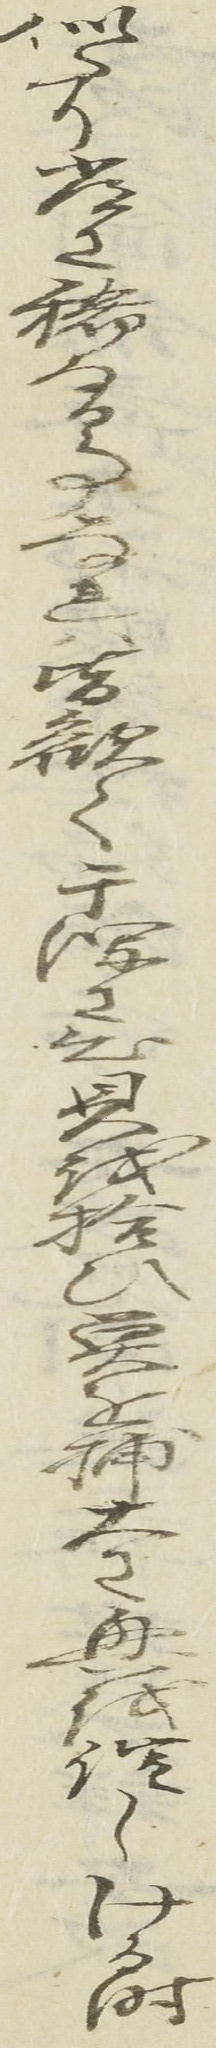似たり常に稀なる事なれハ皆歓て干潟に出貝を拾ひ魚を捕大に興を催しける時
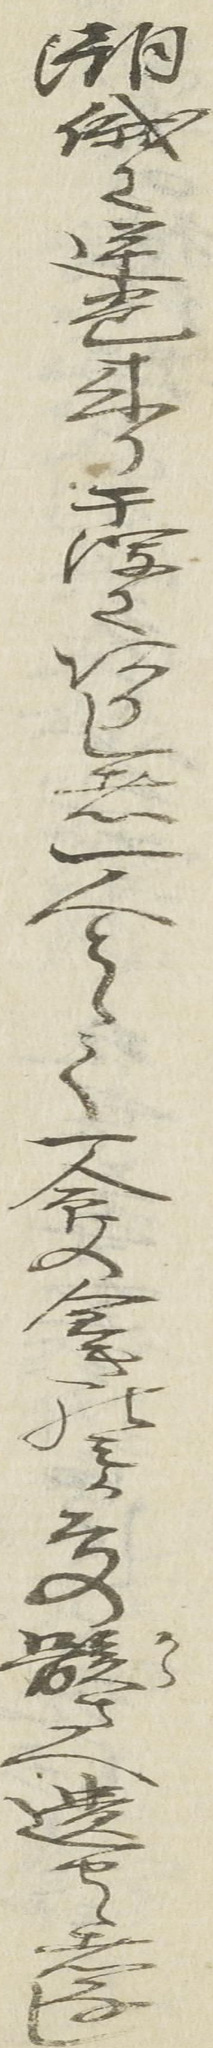潮俄に逆巻来り干潟にありし者一人として一命の全きのみかその骸さへ遺セし者なし
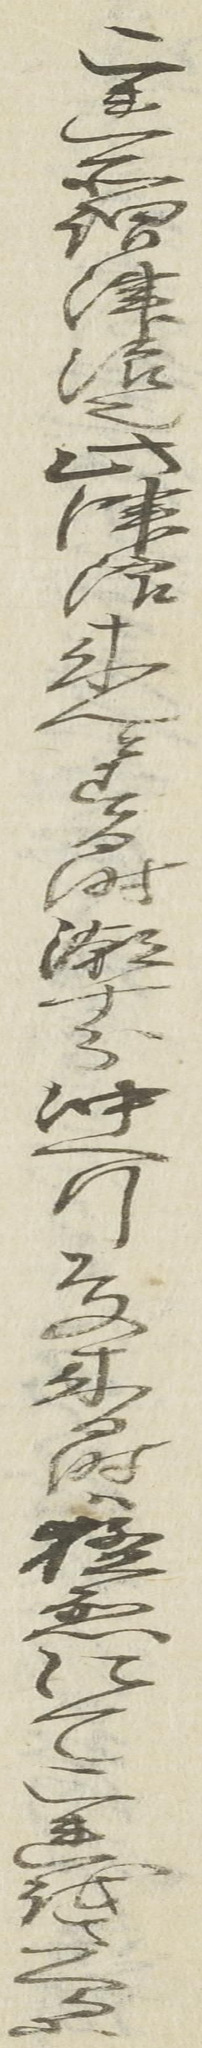これ所謂津浪也此津浪来んとする時潮十分沖へ引その来る時ハ極烈にてこれをさくるに
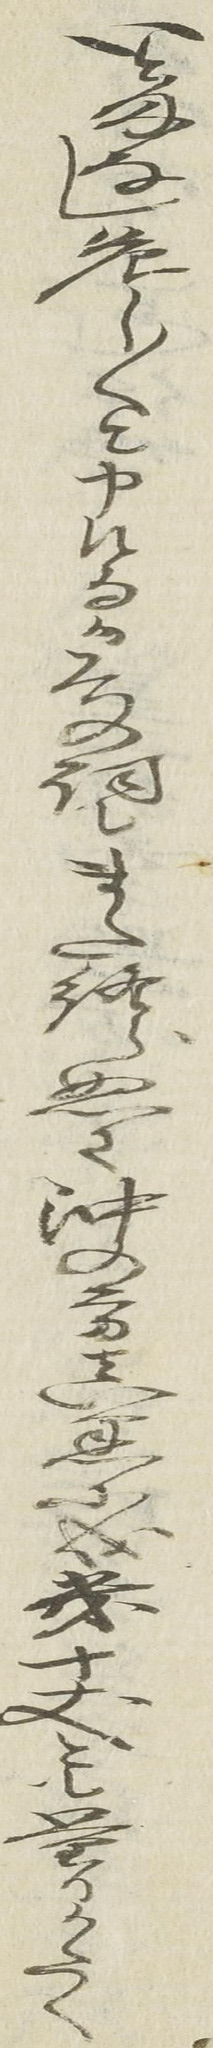いとまなし危し〳〵と申ケるかその詞もまた終らぬに沖の方真黒に成幾十丈とも量りかたく
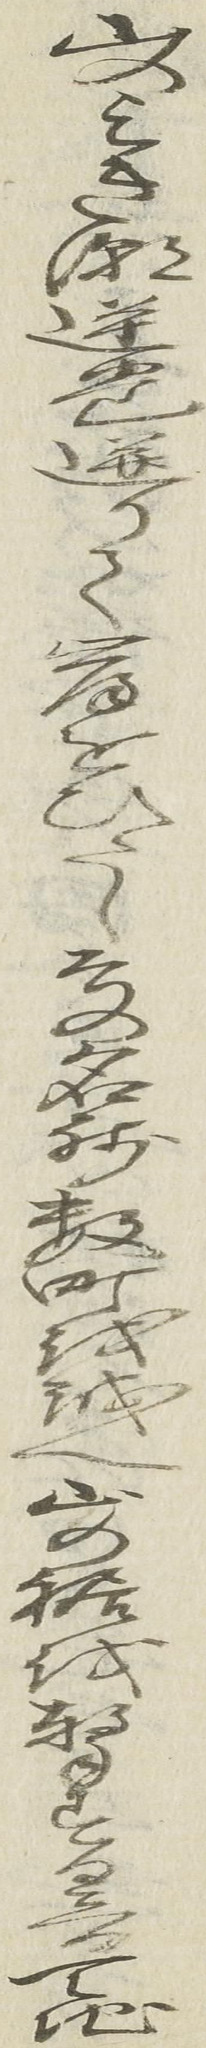山のことき潮逆巻迸りて岸をひたしその名残数町を越へ山の裾を撃する音天地
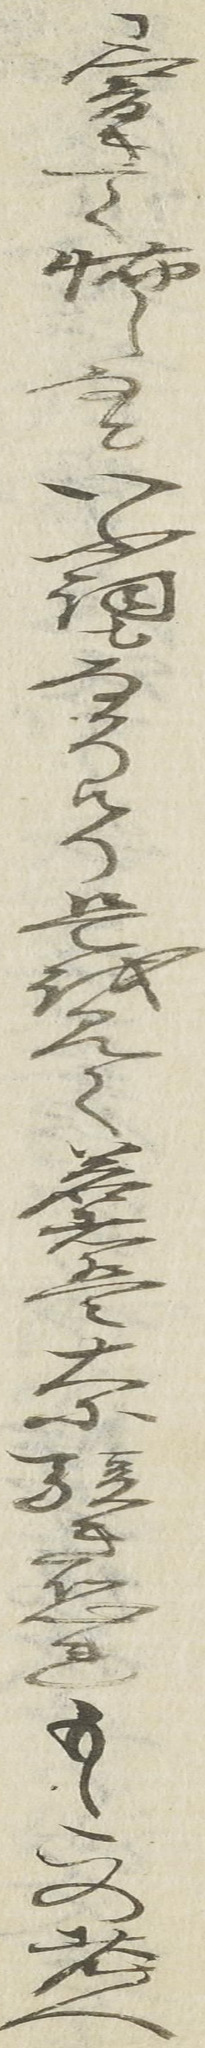に響きて怖しなといふ詞もなかりケり是を見て若者は大に駭き恐れもしこの老人
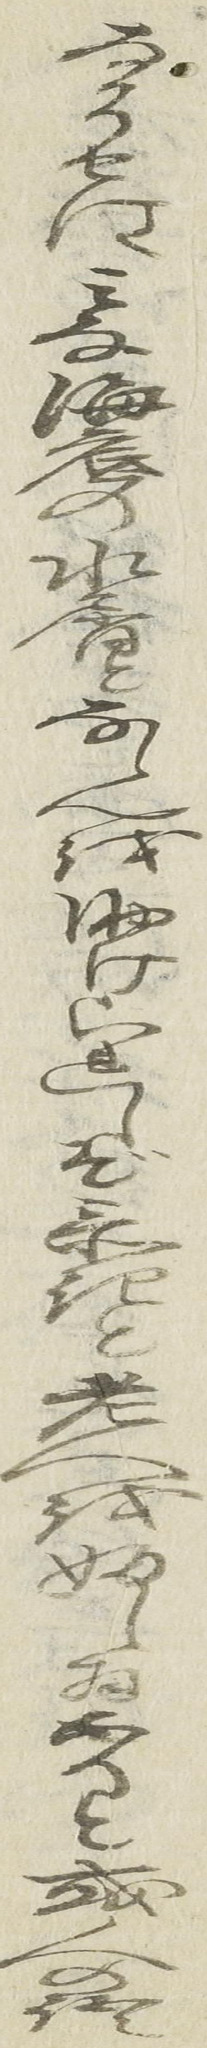なかりセはミな海底の水屑とならんを助けられしぞ忝きと老人をふし拝成りと或人の語
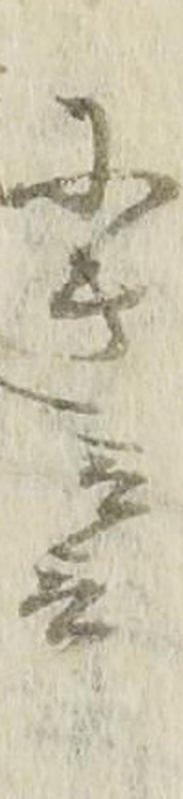にき云云
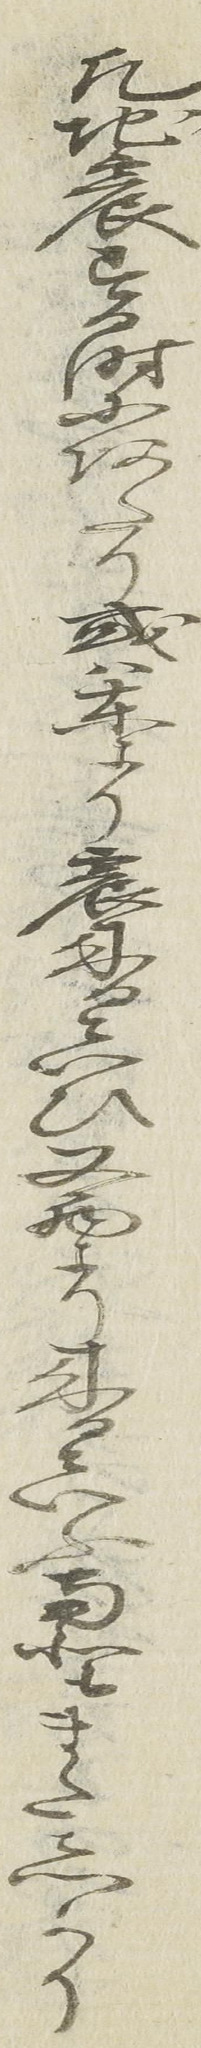一凡地震する時にあたり或ハ東より震来るといひ又西より来るといふ南北もまたしかり
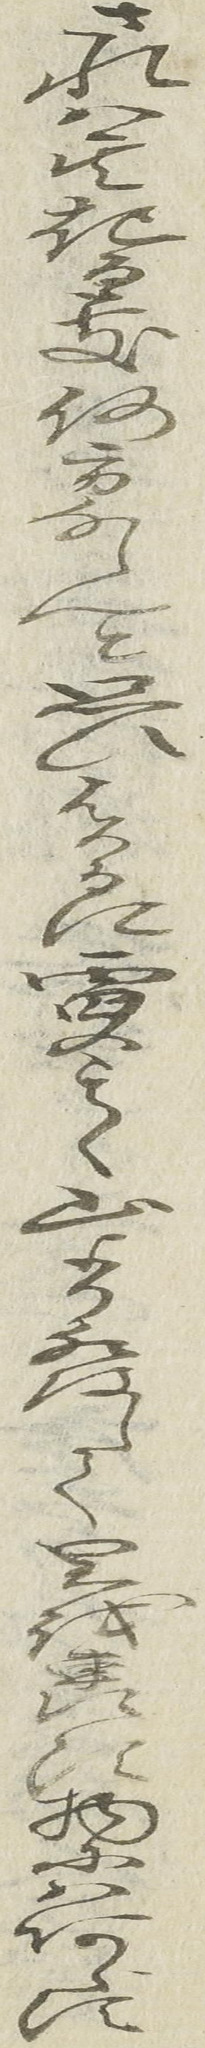されハ其起る処何方ならんと思ひはかるに雷のことく山より発して里を轟す物にハあらす
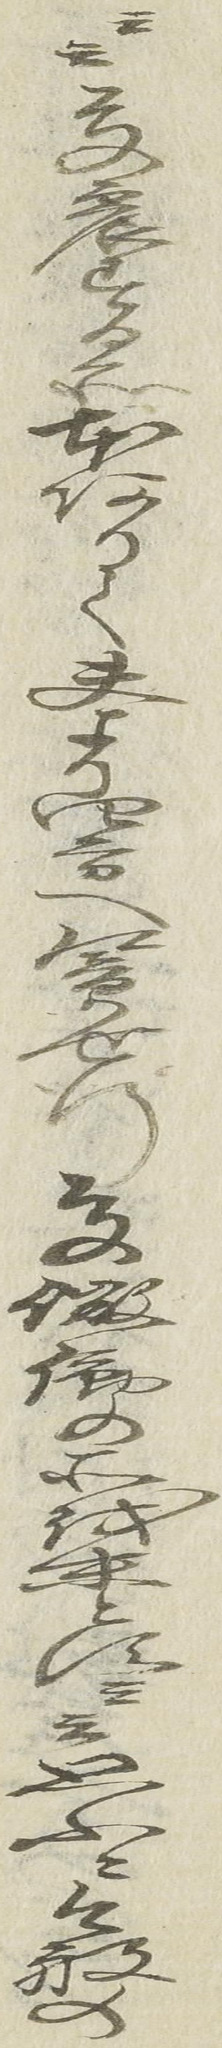云云その震する所本ありて夫より四方へ響かせ行その微働の所を末とす云云思ふ二今般の
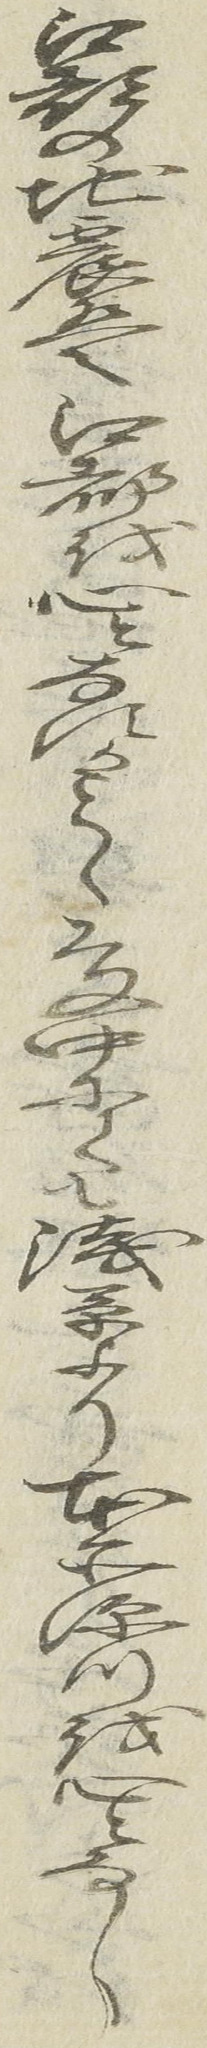江都の地震は江都を心となすかことくその中にても浅草より本所深川を心となし
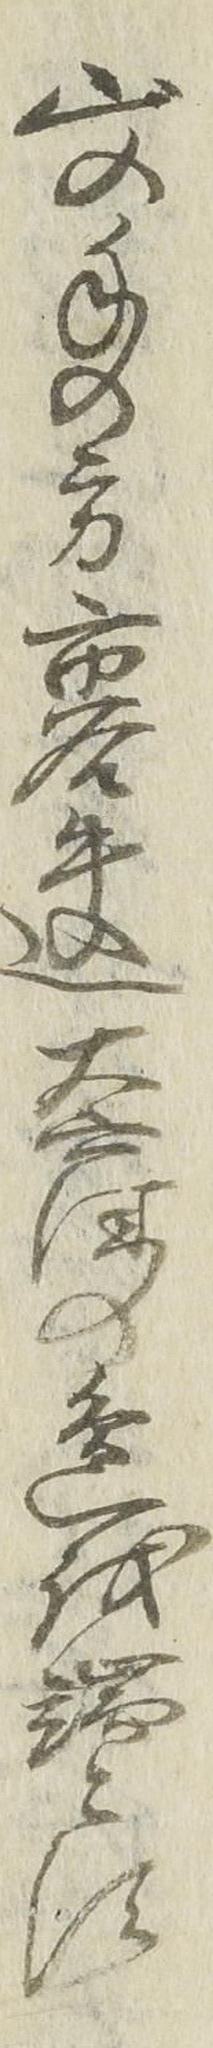山の手の方市谷牛込大窪の辺を端とす

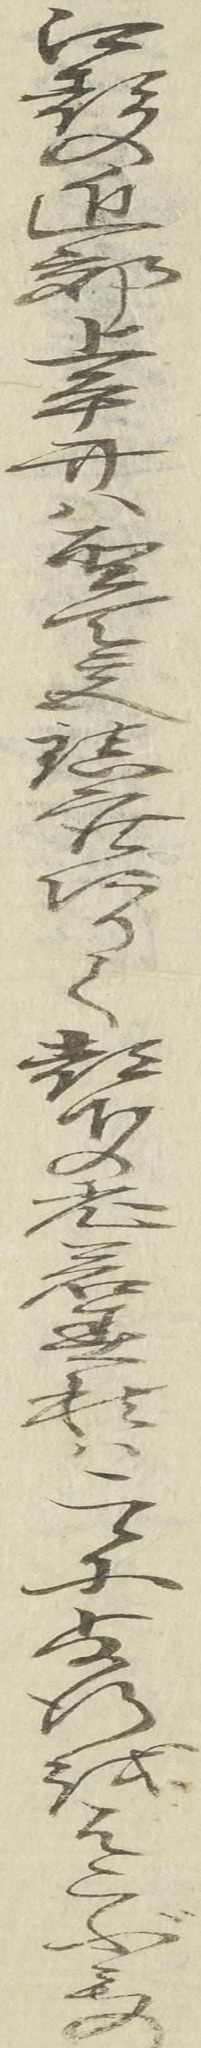江都の近郊上平井ハ聖天宮鎮座ありて都下の老若春秋ハこゝに歩行をはこぶもの
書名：安政乙卯江戸大地震筆記　安政丙辰八月大阪大雷雨之記追加　安政三辰年七月松前辺大地震并八月大風雨記録
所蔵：東京大学地震研究所図書室 Earthquake Research Institute Library, The University of Tokyo, JAPAN
